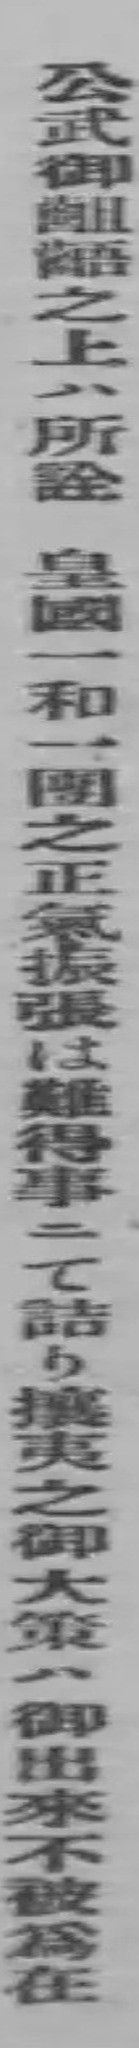公武御齟齬之上ハ所詮皇国一和一団之正気振張は難得事ニて詰り攘夷之御大策ハ御出来不被為在
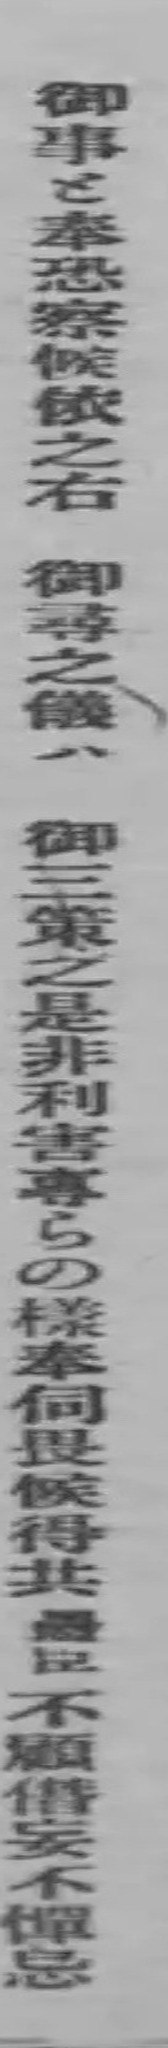御事と奉恐察候依之右御尋之儀ハ御三策之是非利害専らの様奉伺畏候得共愚臣不顧偕妄不憚忌
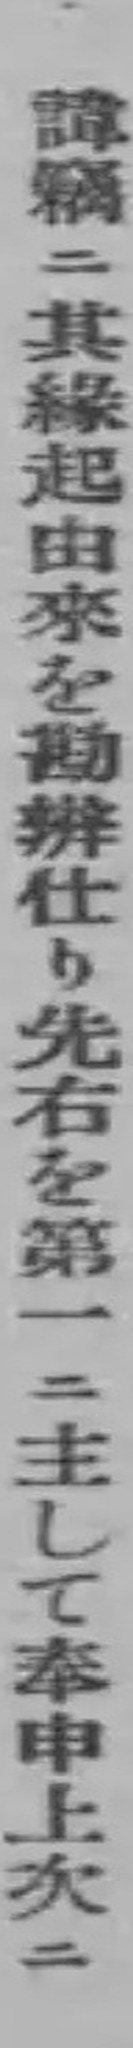諱竊ニ其縁起由来を勘弁仕り先右を第一ニ主して奉申上次ニ
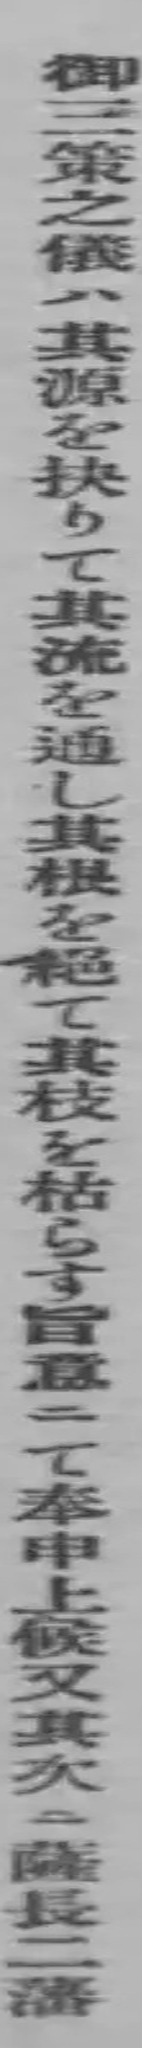御三策之儀ハ其源を抉りて其源を通し其根を絶て其枝を枯らす旨意ニて奉申上候又其次ニ薩長二藩
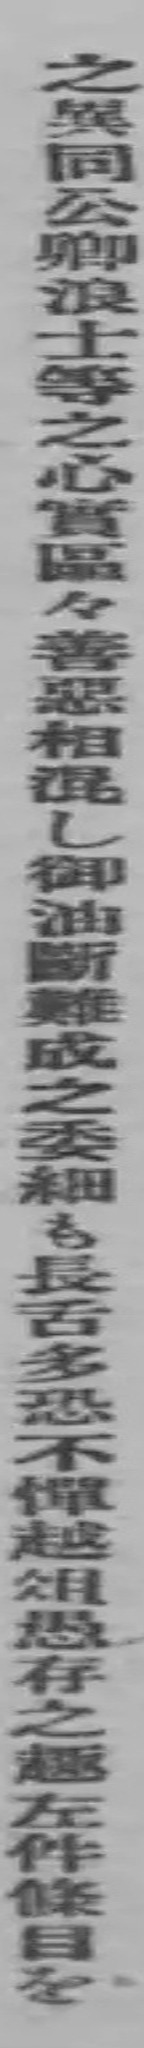之異同公卿浪士等之心実区々善悪相混し御油断難成之委細も長舌多恐不憚越俎愚存之趣左件條目を
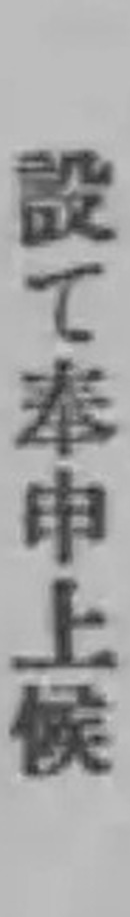設て奉申上候
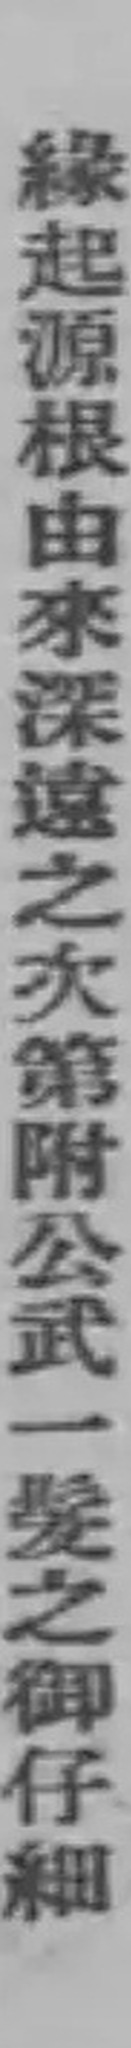縁起源根由来深遠之次第附公武一髪之御仔細
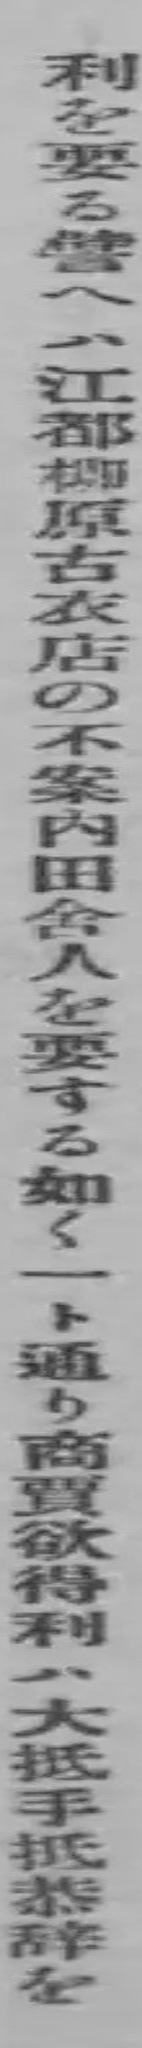利を要る譬へハ江都柳原古衣店の不案内田舎人を要する如く一ト通り商売欲得利ハ大抵手抵恭辞を
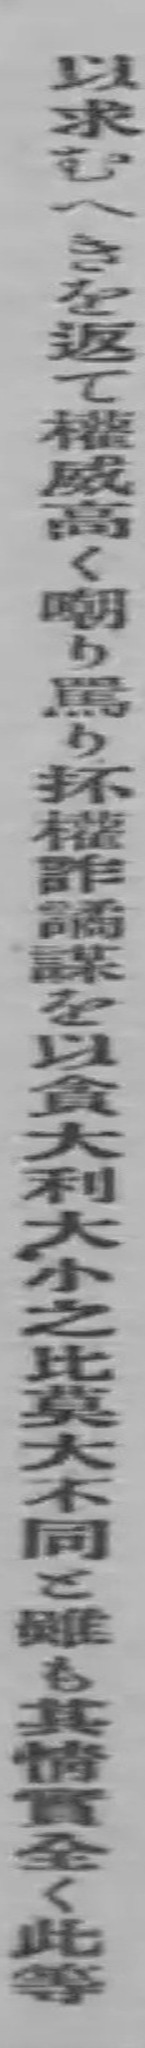以求むへきを返て権威高く嘲り罵り抔権詐譎謀を以貧大利大小之比莫大不同と雖も其情実全く此等
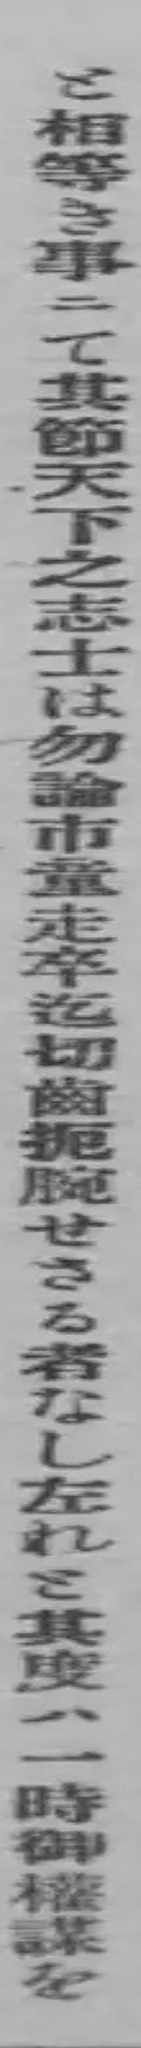と相等き事ニて其節天下之志士は勿論市童走卒迄切歯扼腕せさる者なし左れと其度は一時御権謀を

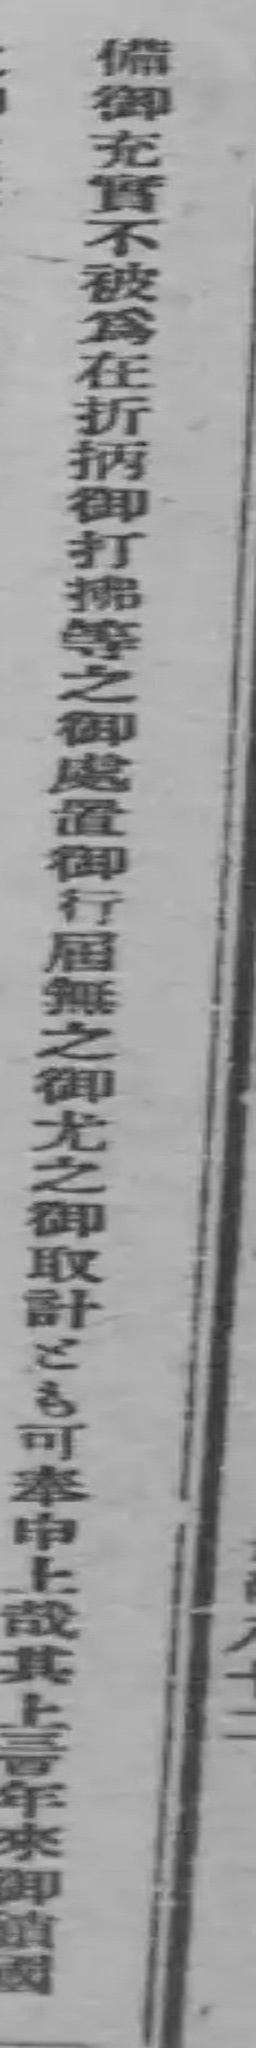備御充実不被為在折柄御打払等之御処置御行届無之御尤之御取計とも可奉申上哉其上三百年来御鎖国
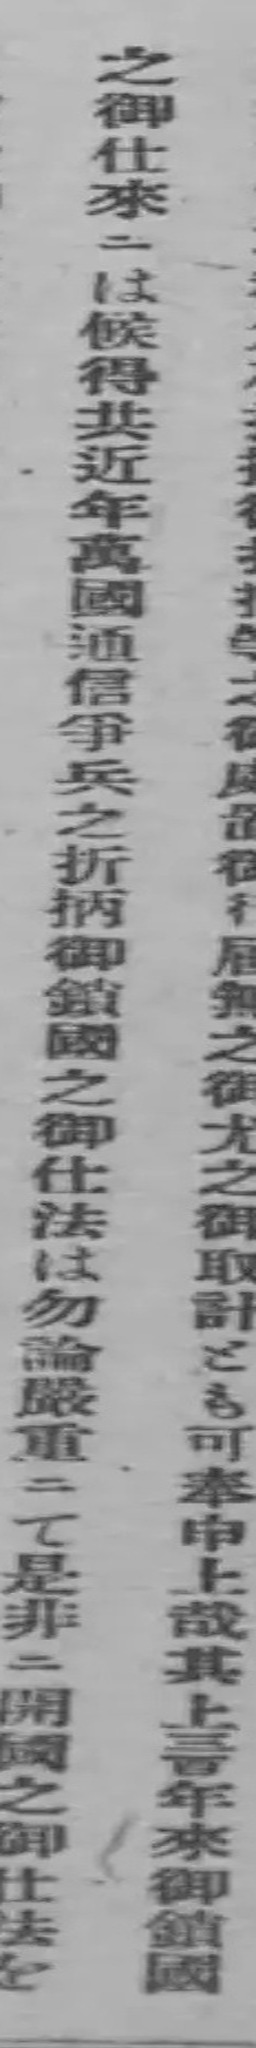之御仕來ニは候得共近年万国通信争兵之折柄御鎖国之御仕法は勿論厳重ニて是非ニ開国之御仕法を
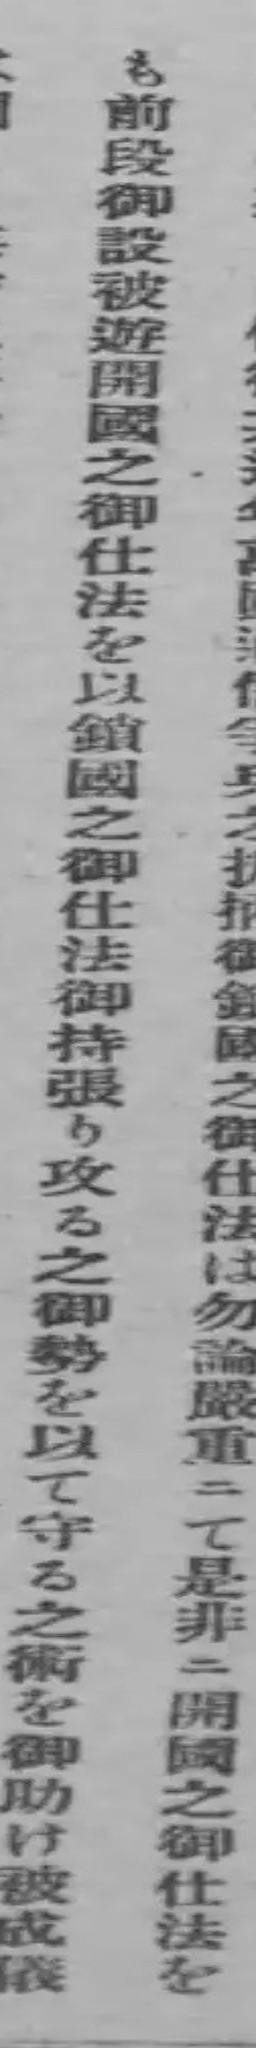も前段御設被遊開国之御仕法を以鎖国之御仕法御持張り攻る之御勢を以て守る之術を御助け被成儀
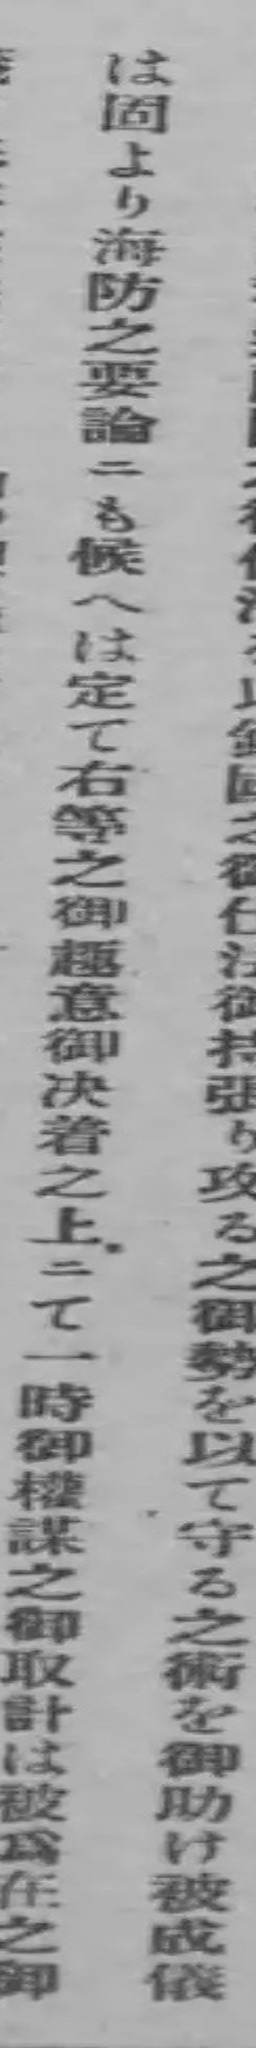は固より海防之要論ニも候へは定て右等之御趣意御決着之上ニて一時御権謀之御取計は被為在之御
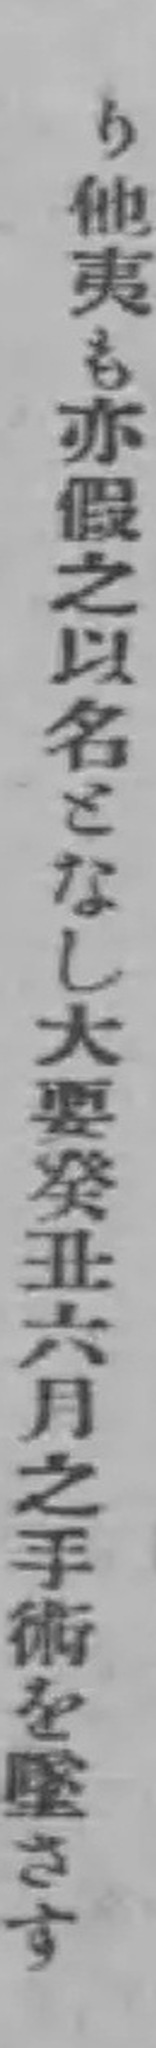り他夷も亦仮之以名となし大要癸丑六月之手紙を墜さす
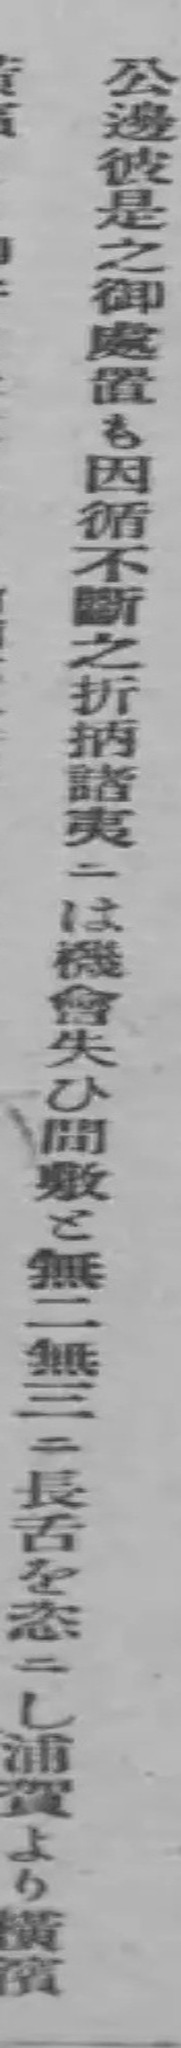公辺彼是之御処置も因循不断之折柄諸夷ニは機会失ひ間敷と無二無三ニ長舌を恣ニし浦賀より横浜
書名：豊橋市史談
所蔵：国立国会図書館 National Diet Library, JAPAN
